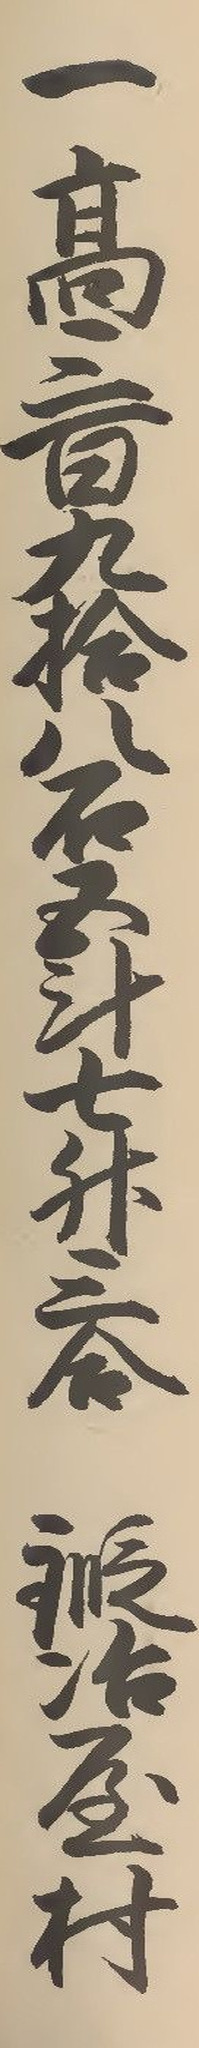一髙三百九拾八石五斗七升三合鍛冶屋村
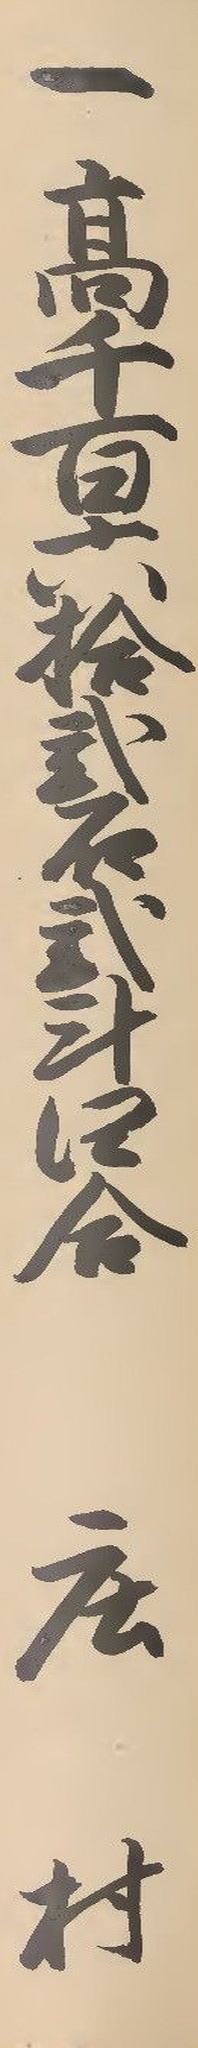一髙千百六拾弐石弐斗四合庄村
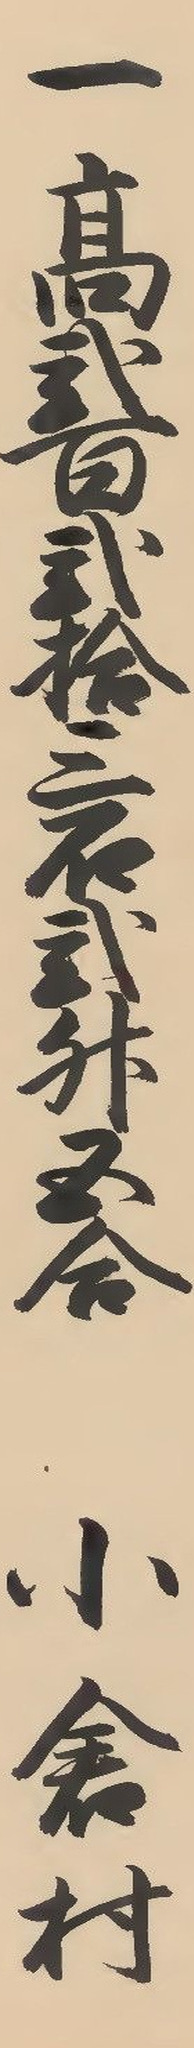一髙弐百弐拾三石弐升五合小倉村
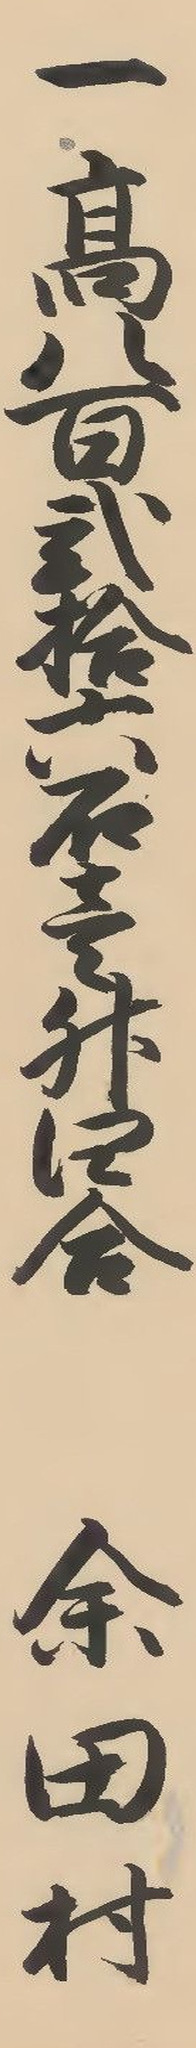一髙八百弐拾六石壱升四合余田村
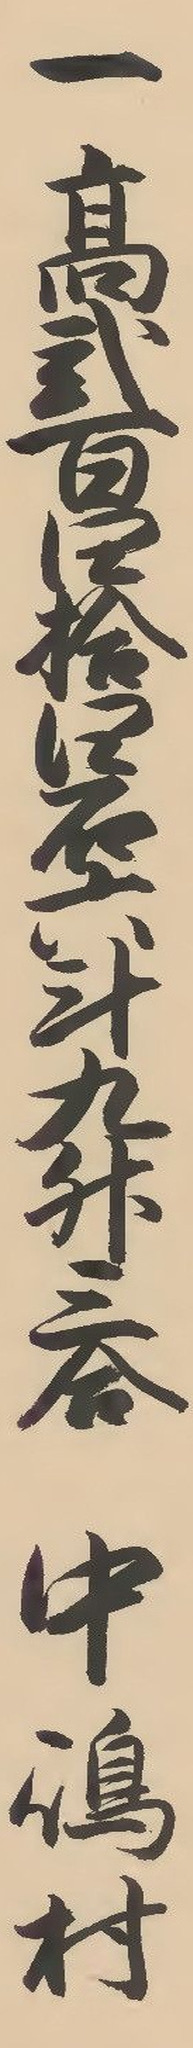一髙弐百四拾四石六斗九升三合中嶋村

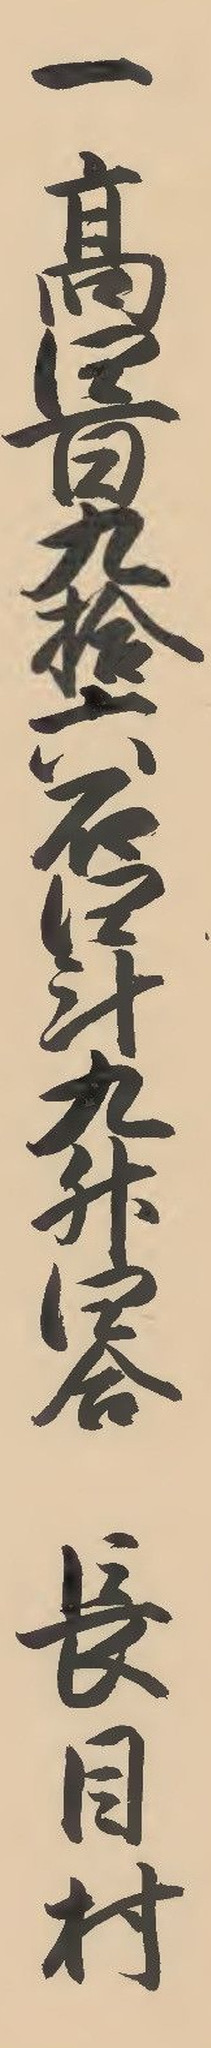一髙四百九拾六石四斗九升四合長目村
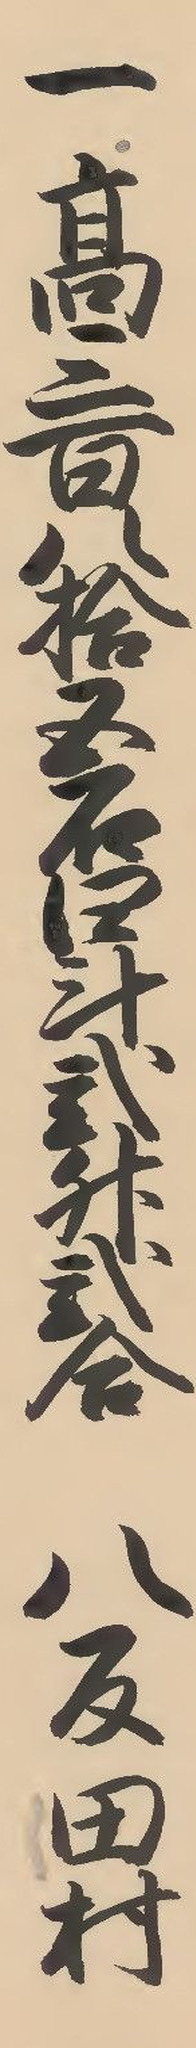一髙三百八拾五石四斗弐升弐合八反田村
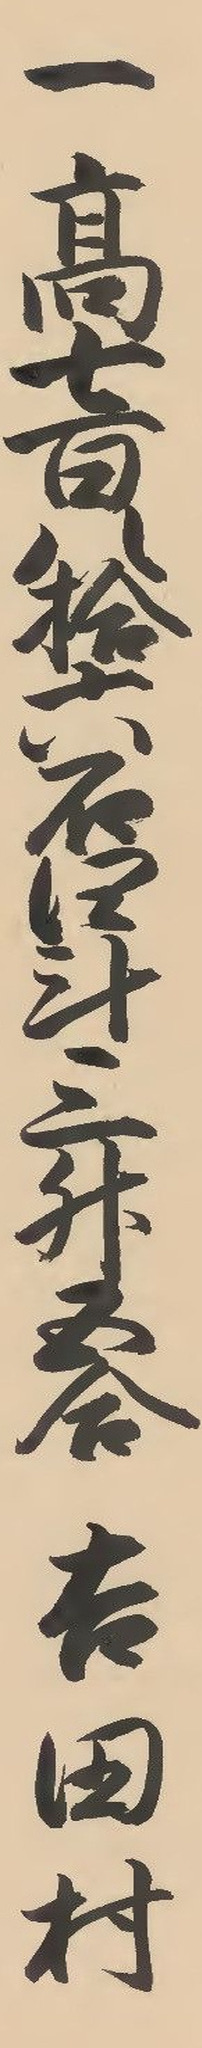一髙七百八拾六石四斗三升五合吉田村
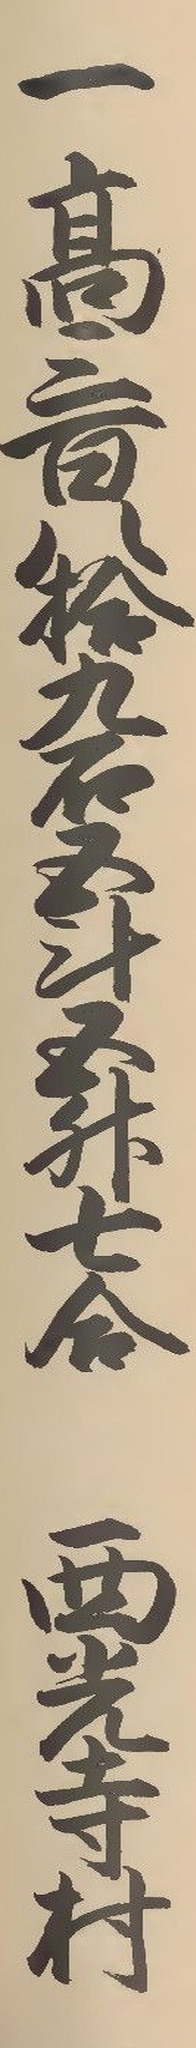一髙弐百八拾九石五斗五升七合西光寺村
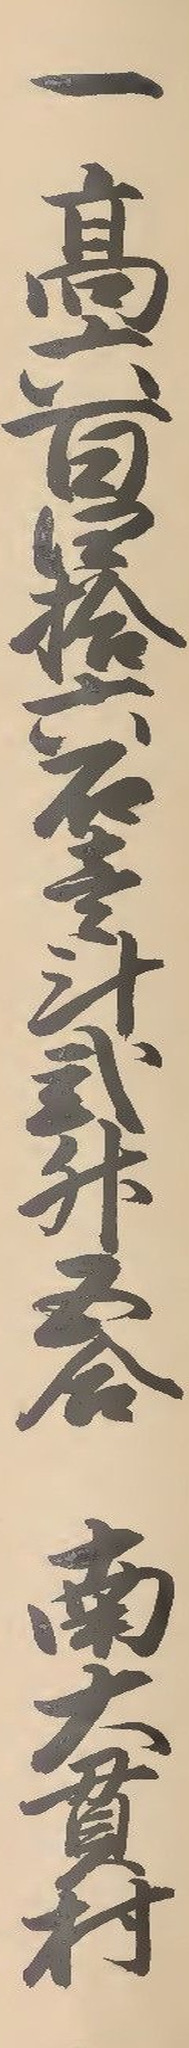一髙六百四拾六石壱斗弐升五合南大貫村
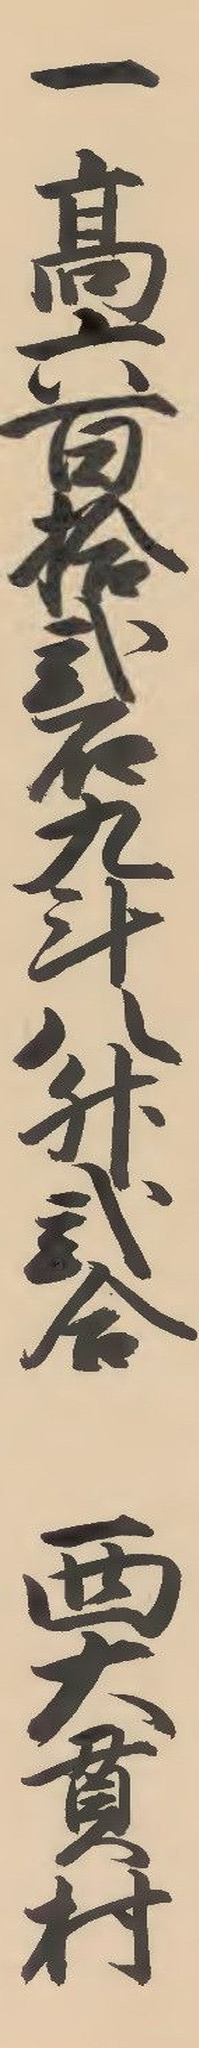一髙六百拾弐石九斗八升弐合西大貫村
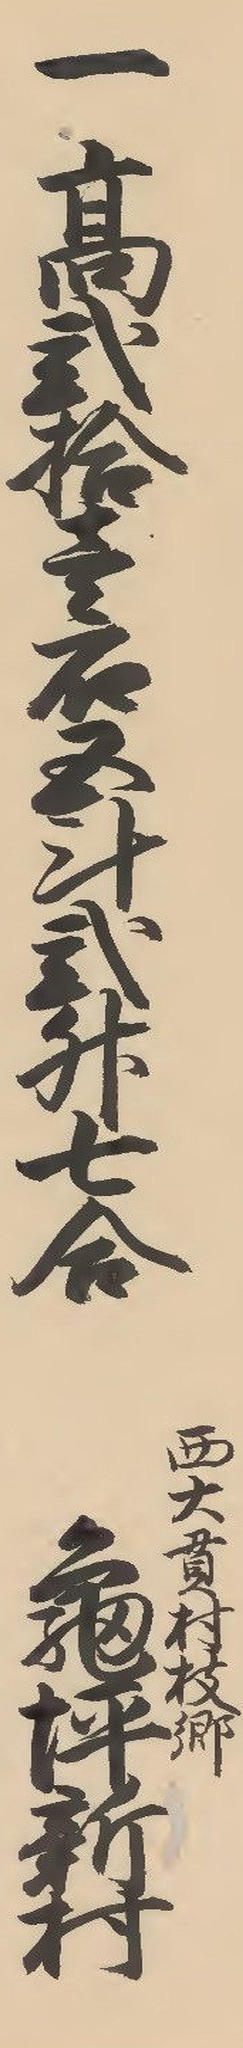一髙弐拾壱石五斗弐升七合龜坪新村
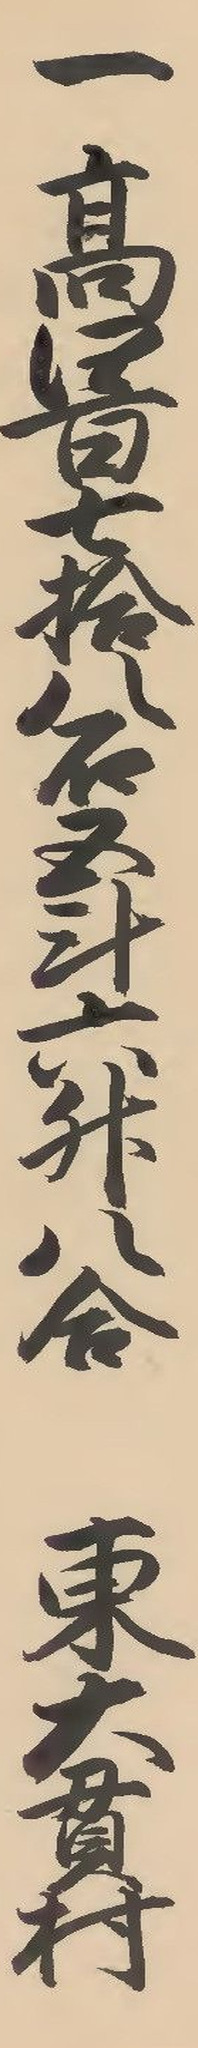一髙四百七拾八石五斗六升八合東大貫村

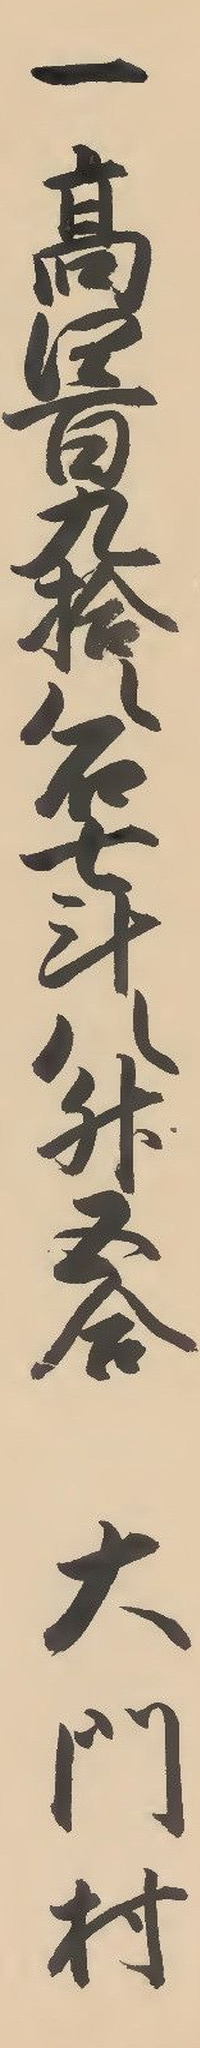一髙四百九拾八石七斗八升五合大門村
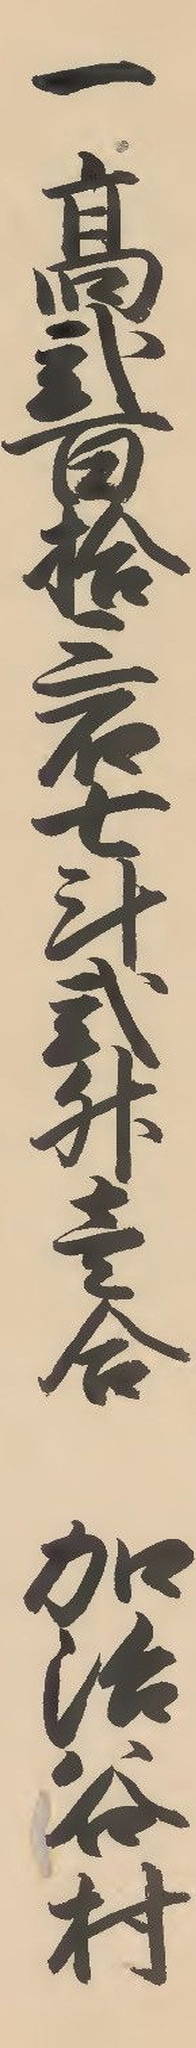一髙弐百拾三石七斗弐升壱合加治谷村
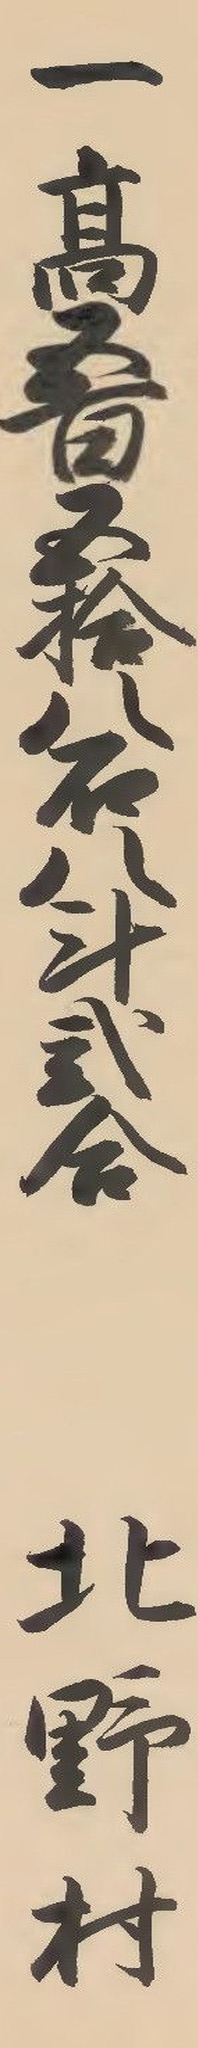一髙五百五拾八石八斗弐合北野村
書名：播磨国郷帳
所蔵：国立公文書館 National Archives of Japan
